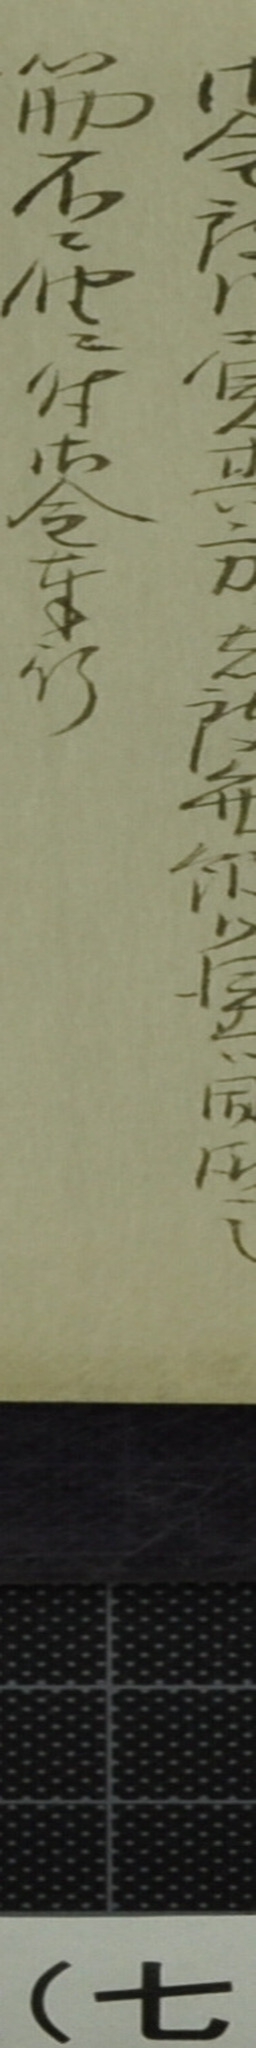筋不届付御金奉行
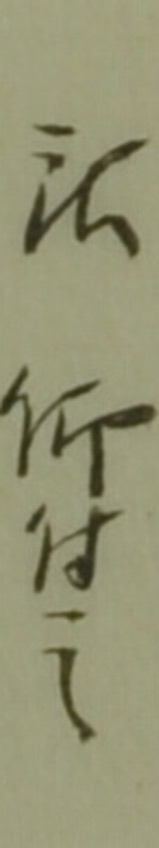被仰付之
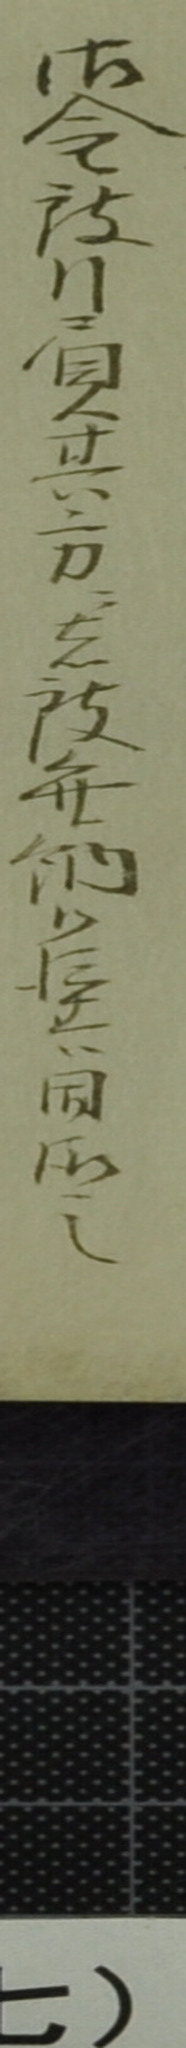御金致引負其方者致弁納候得共同様之
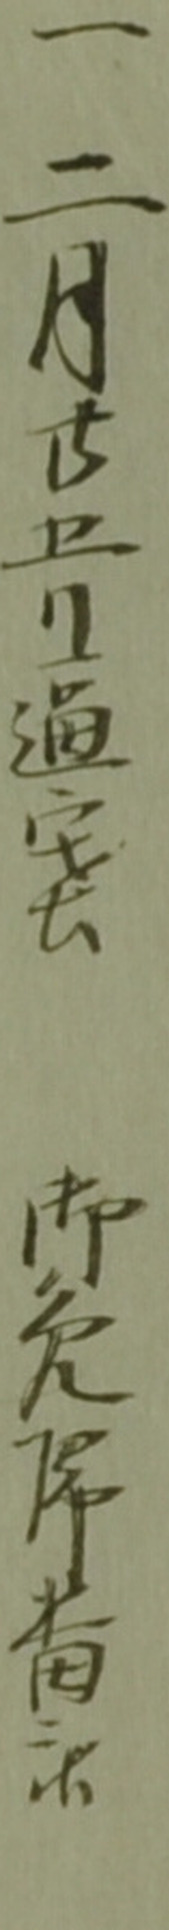一二月廿五日逼塞御免帰番被
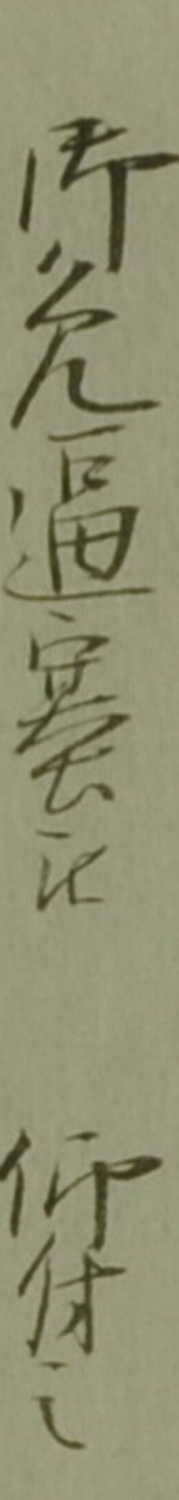御免逼塞被仰付之
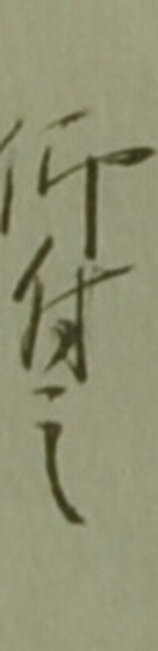仰付之
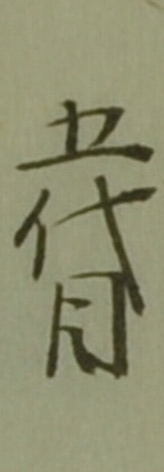五代目
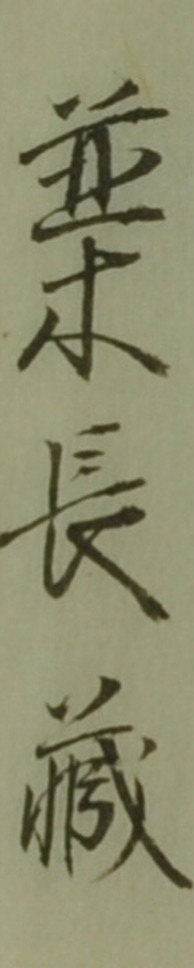並木長蔵
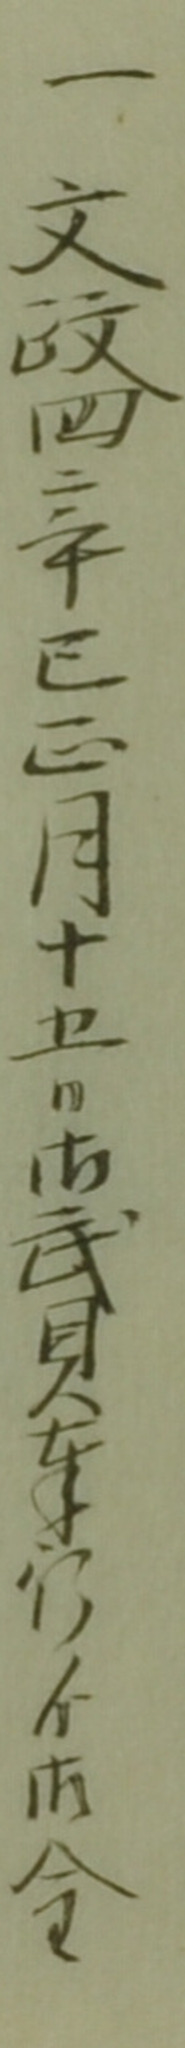一文政四辛巳正月十五日御武具奉行ゟ御金
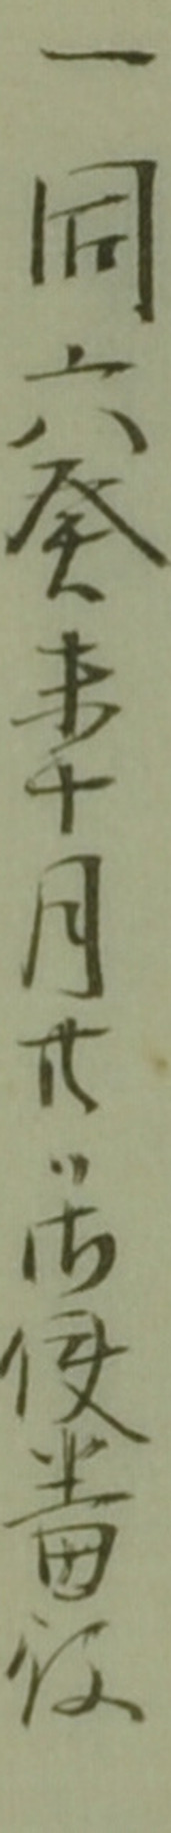一同六癸未十月廿日御使番役
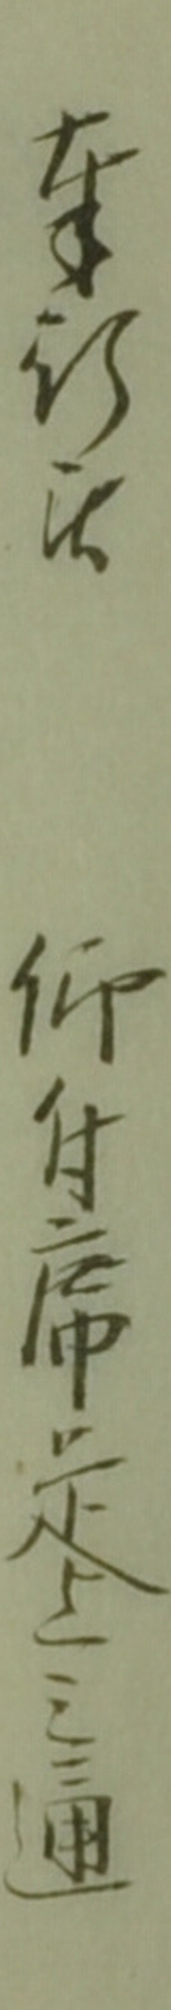奉行被仰付席是迄之通
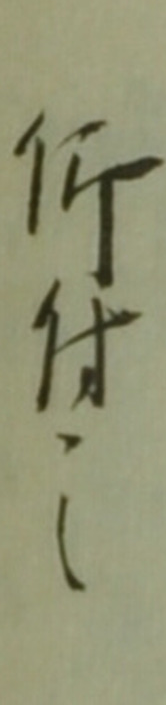仰付之
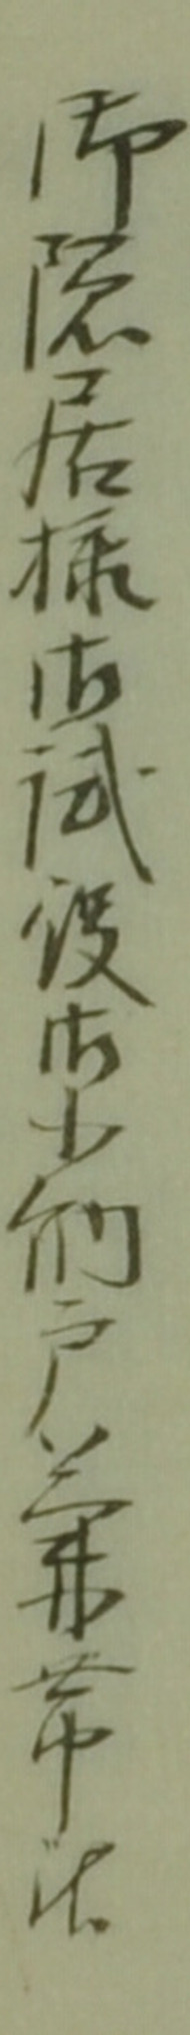御隠居様御試役御小納戸兼帯被
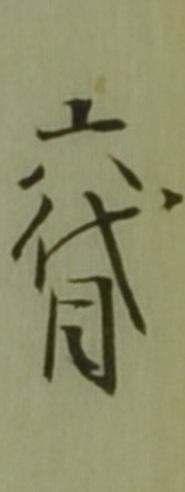六代目
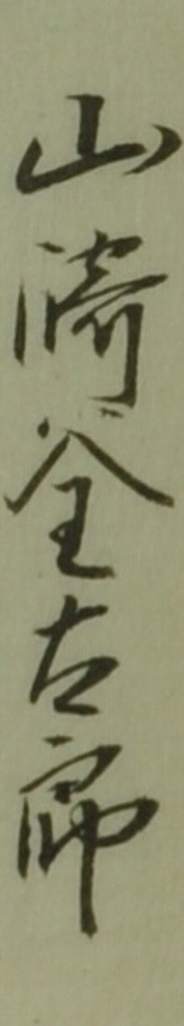山崎釜太郎
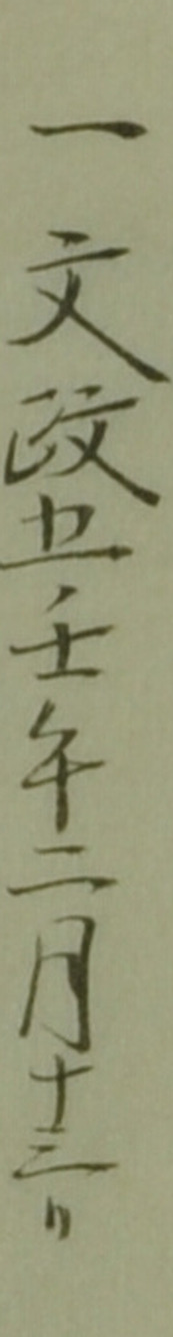一文政五壬午二月十三日
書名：諸御役代々録（七）
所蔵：伊那市立高遠町図書館・合同会社AMANE
